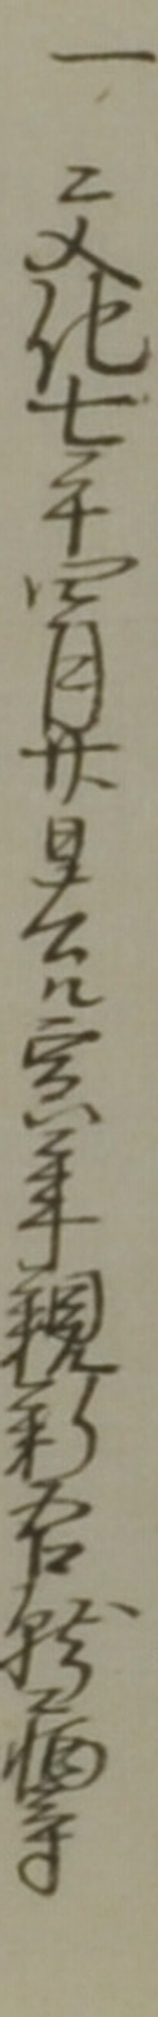一文化七午四月廿日去ル寅年親新吾就病気
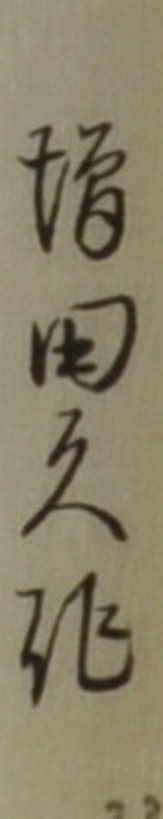増田久作
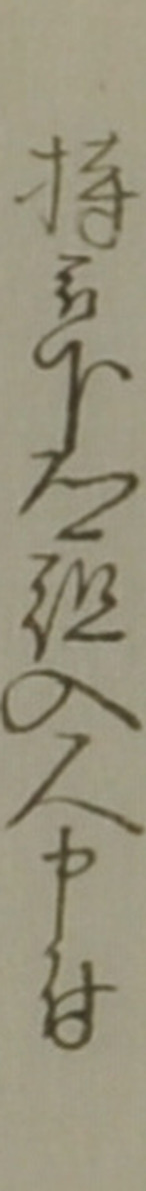持被下郷組入人申付
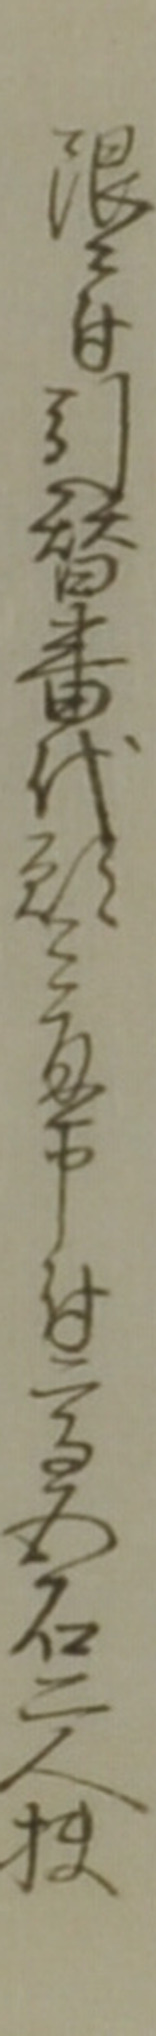限ニ付引替番代願之通申付高五石二人扶
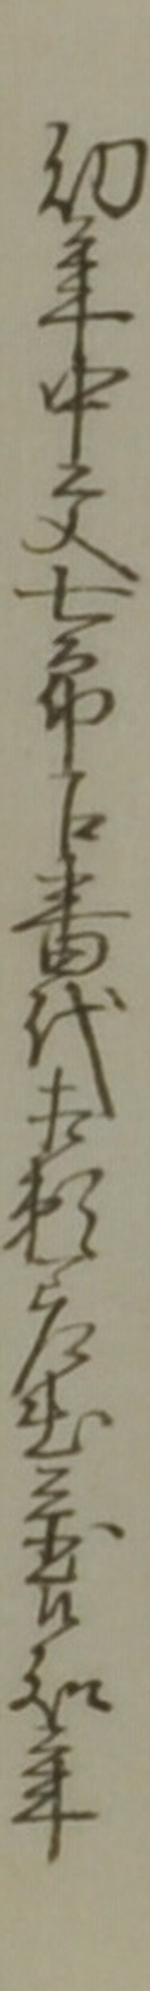幼年中文七郎江番代相頼差出置候処年
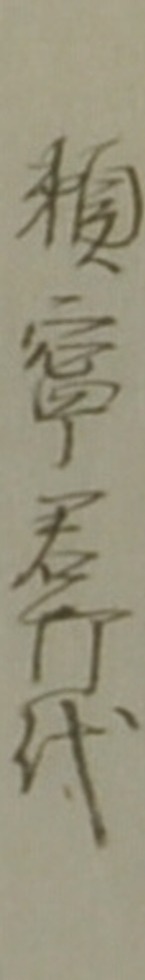頼寧君御代
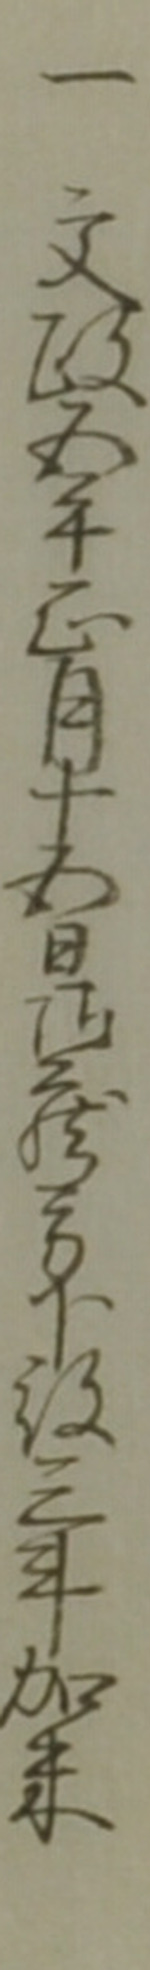一文政五午正月十五日御蔵方下役三斗加米
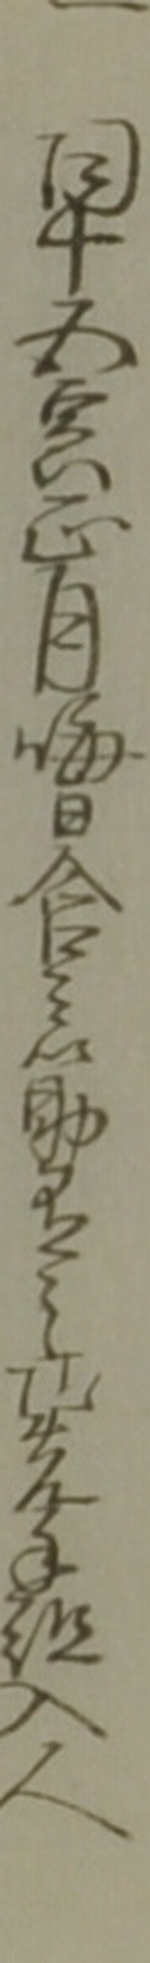一同十五寅正月晦日含之筋有之御先手組入人
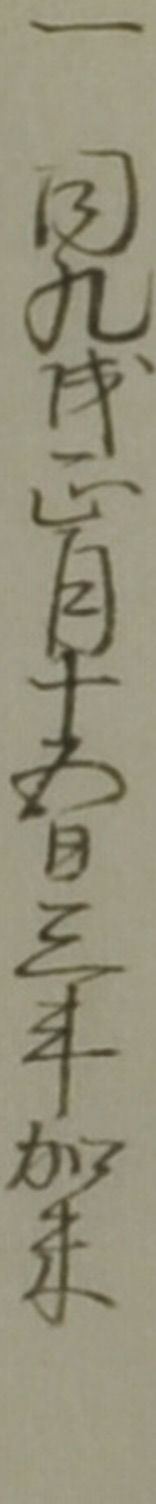一同九戌正月十五日元〆物書申付
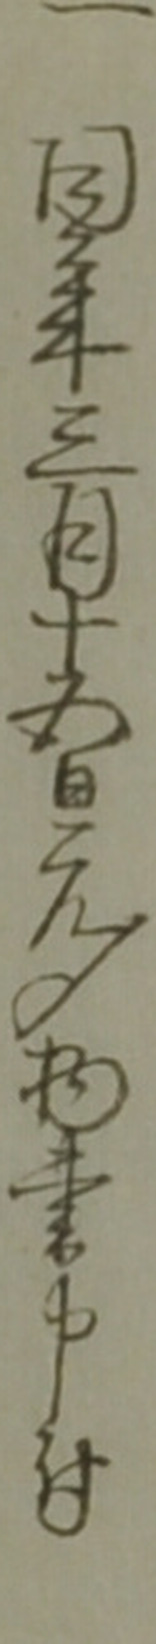一同九戌正月十五日元〆物書申付
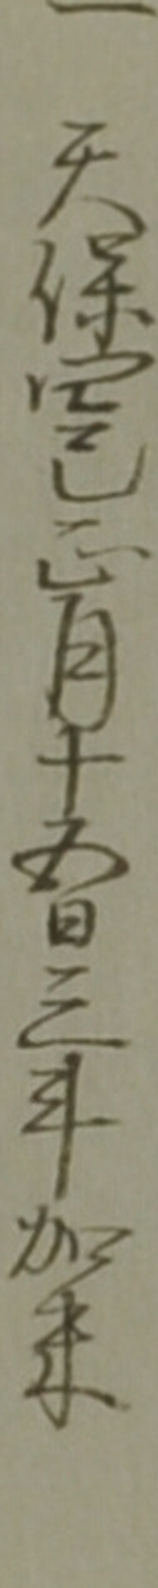一天保四巳正月十五日三斗加米
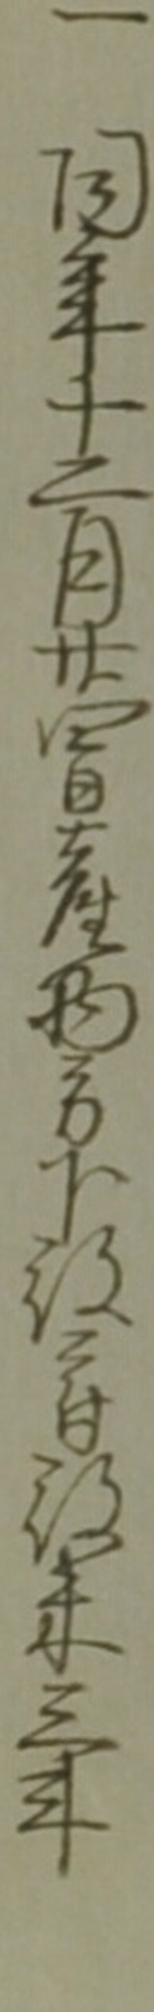一同年十二月廿四日産物方下役ニ付役米三斗
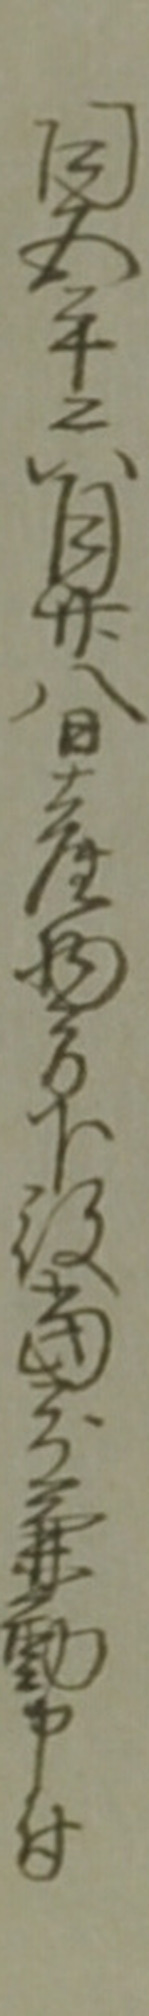一同五午六月廿八日産物方下役当分兼勤申付
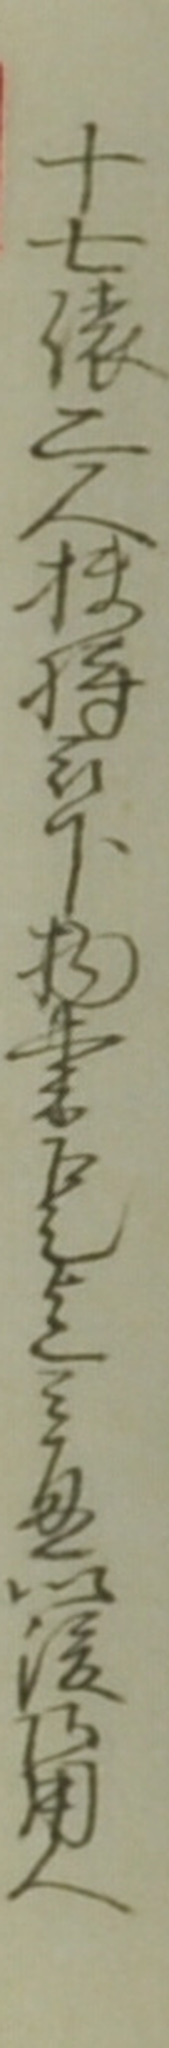十七俵二人扶持被下物書是迄之通以後御用人
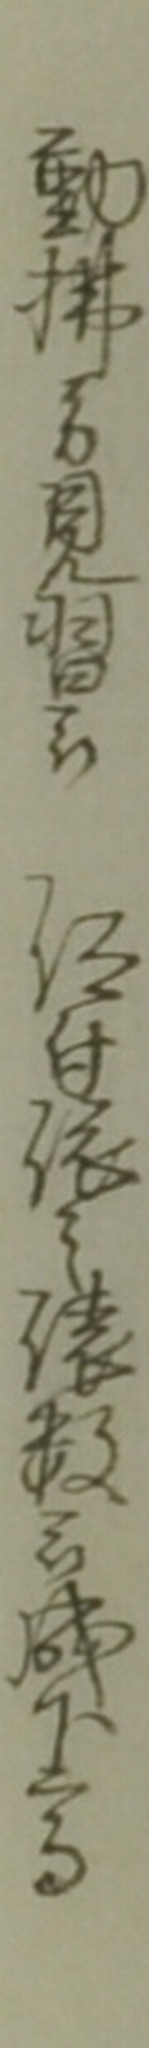勤払方見習被仰付依之俵数被成下高
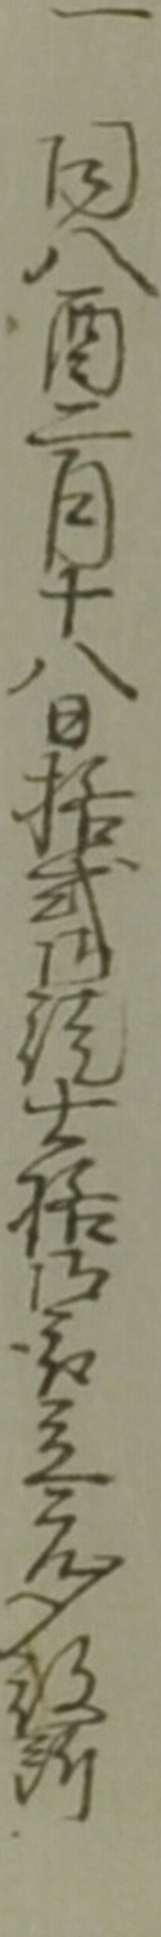一同八酉二月十八日格式御徒士格御取立元〆役所
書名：無足諸士勤仕録（七）
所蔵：伊那市立高遠町図書館・合同会社AMANE
